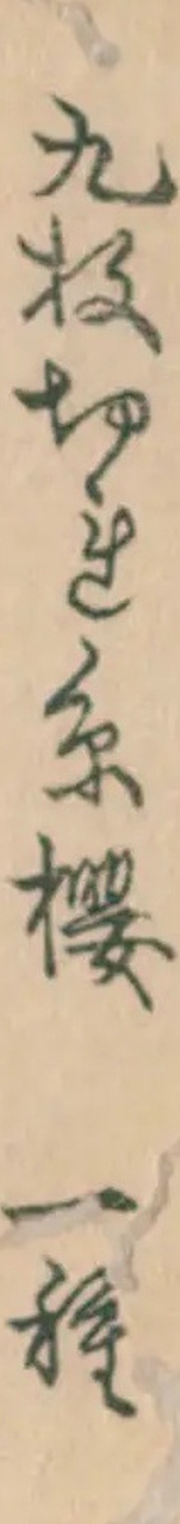九枚切れ糸桜一種
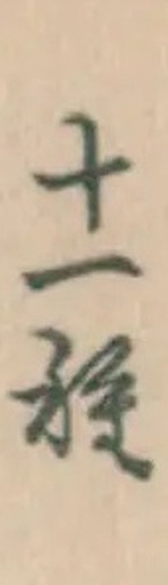十一種
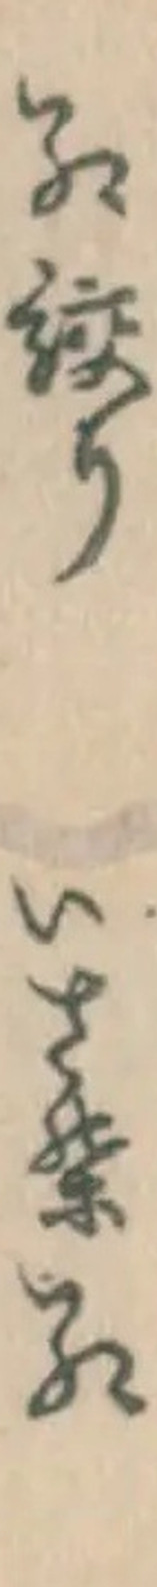紅絞りいさ葉紅
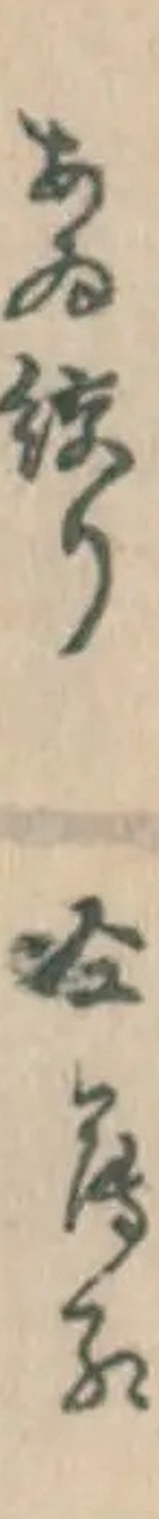あゐ絞り仝薄紅

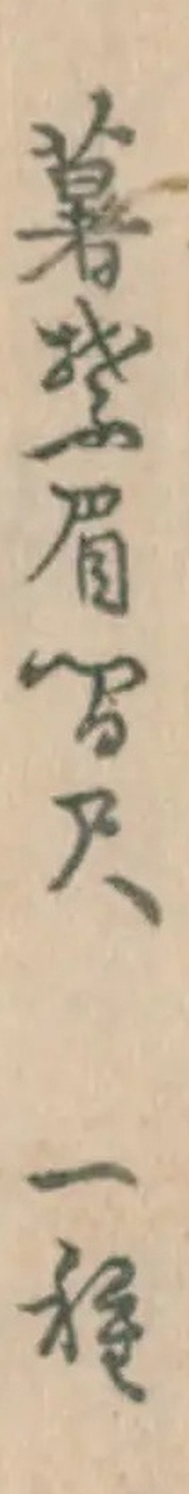薯葉眉間尺一種
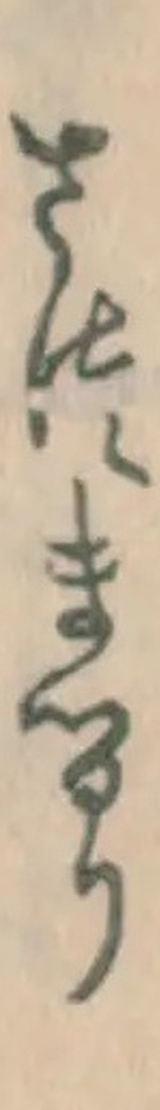さつまるり
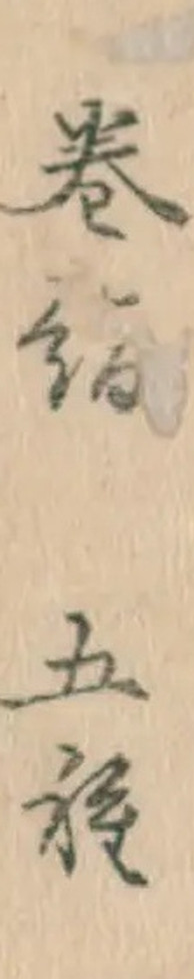巻絹五種

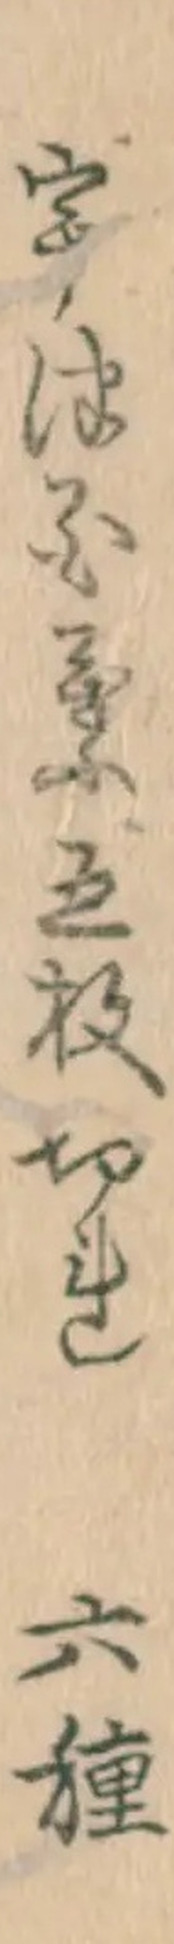宇津花葉五枚切れ六種
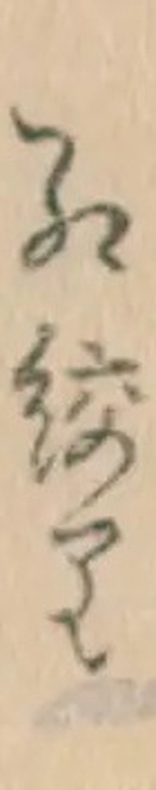紅絞り
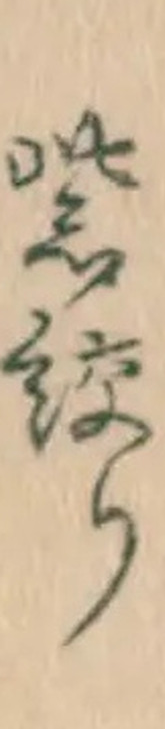紅絞り
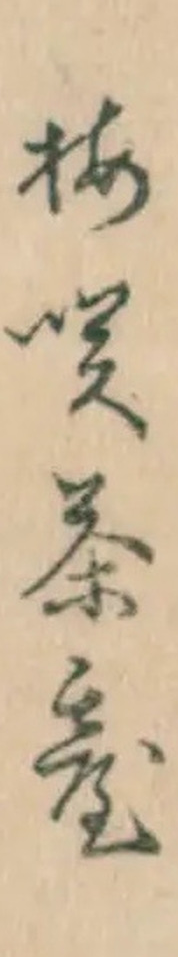梅咲茶台

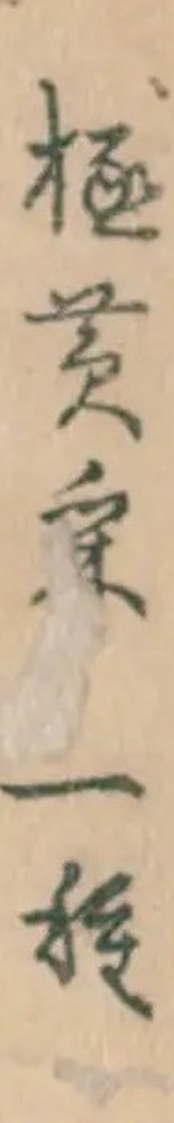極黄采一種
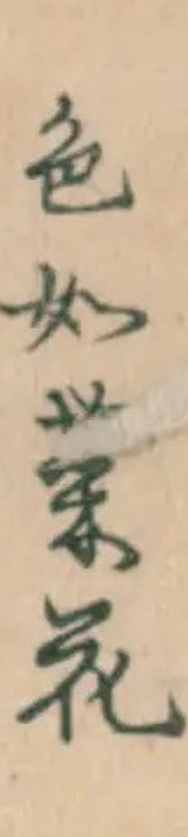色如菊花
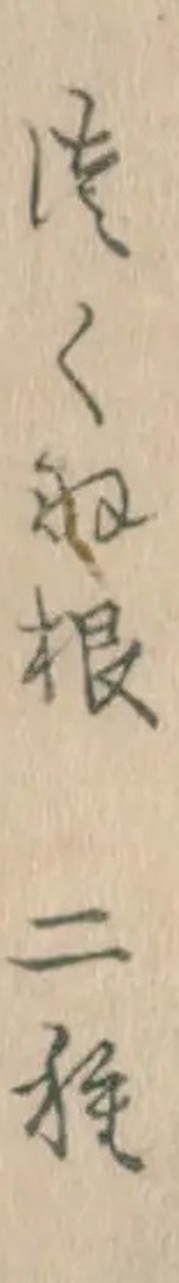つく羽根二種
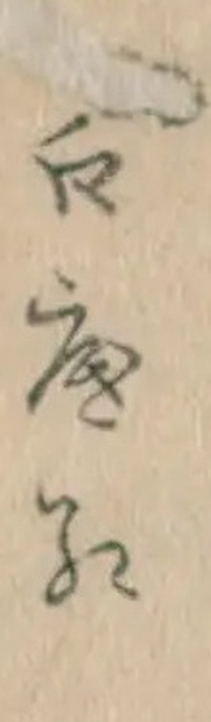白底紅
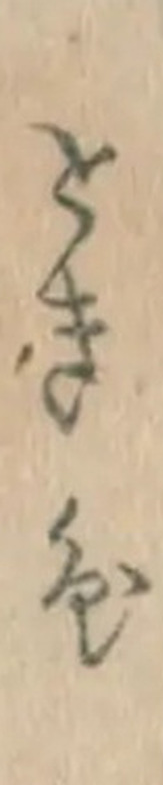とき色
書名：朝顔叢. 上巻
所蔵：国立国会図書館 National Diet Library, JAPAN
